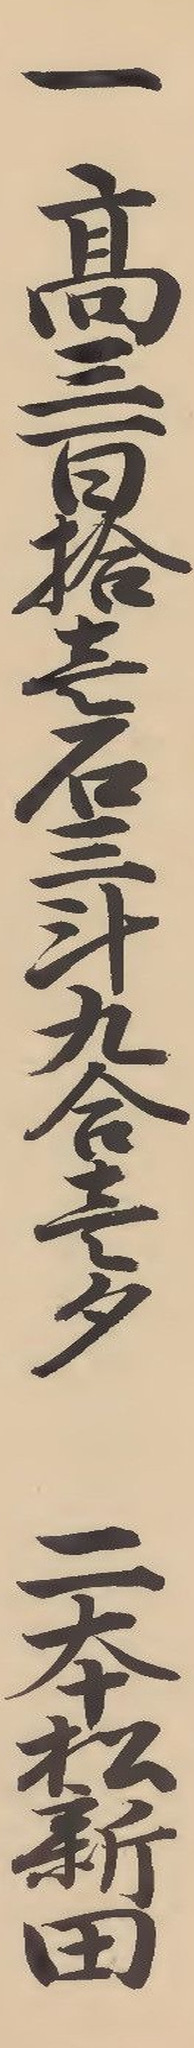一高三百拾壱石三斗九合壱勺二本松新田
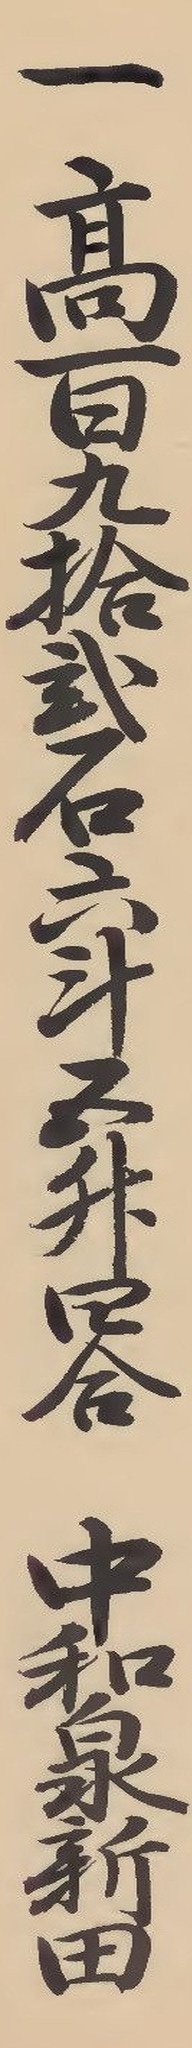一高百九拾弐石六斗五升四合中和泉新田

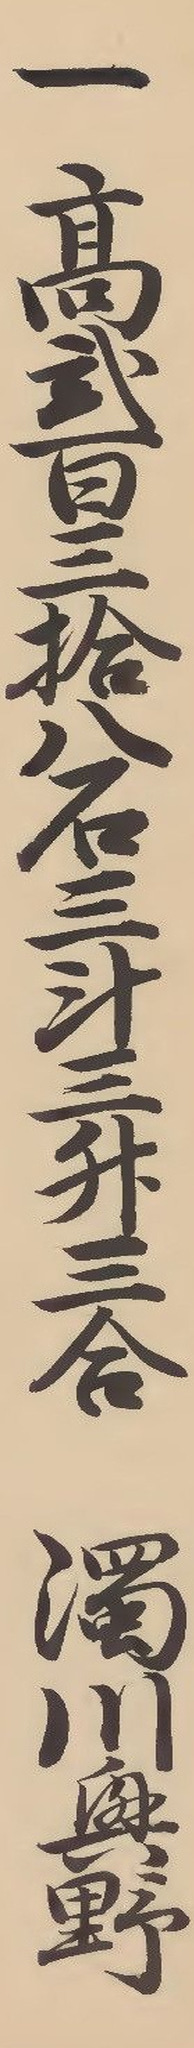一高弐百三拾八石三斗三升三合濁川興野
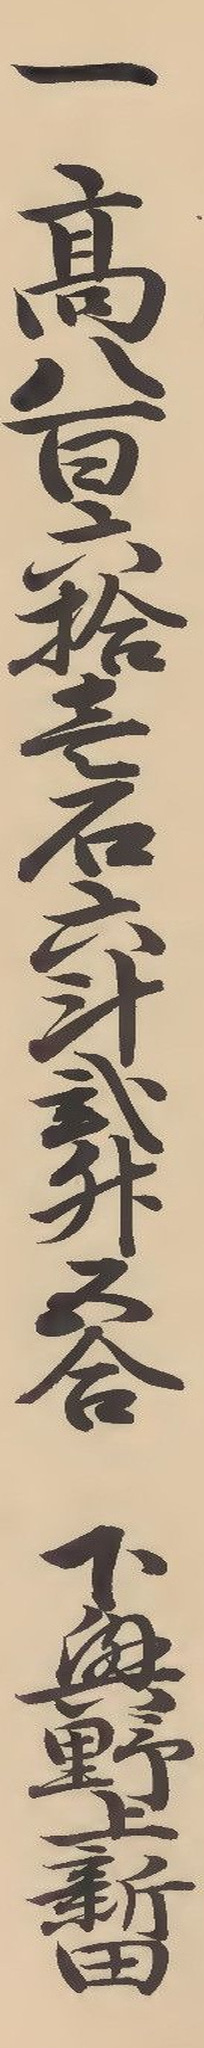一高八百六拾壱石六斗弐升五合下興野上新田
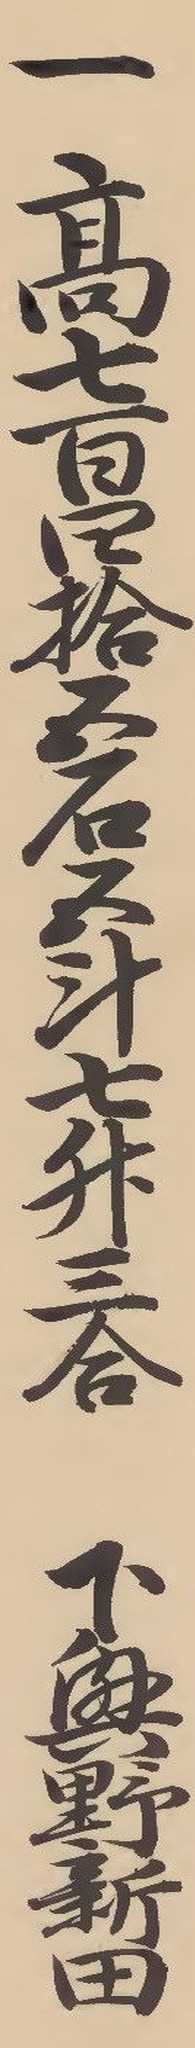一高七百四拾五石五斗七升三合下興野新田
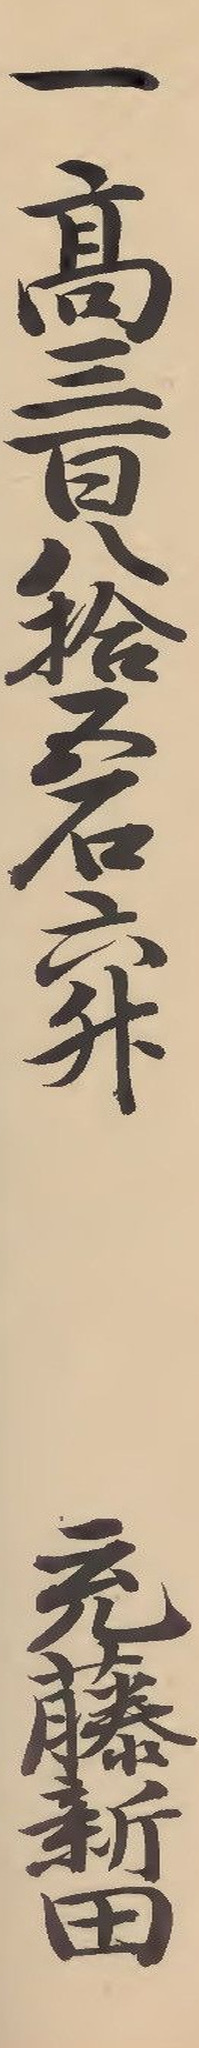一高三百八拾五石六升充藤新田
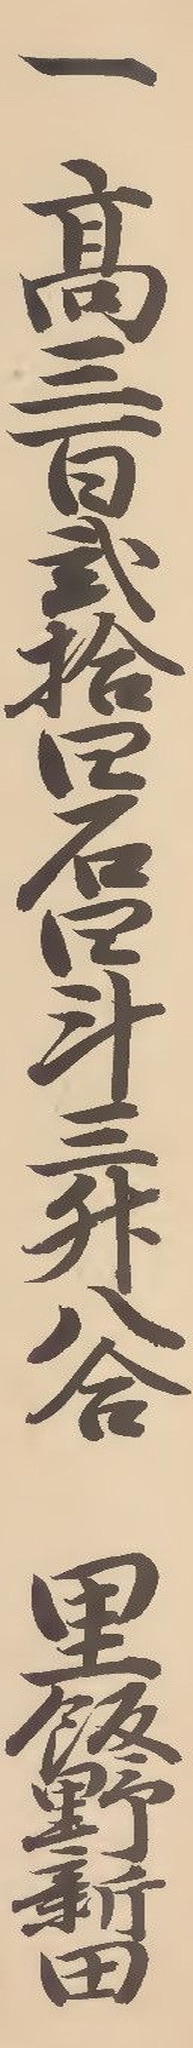一高三百弐拾四石四斗三升八合里飯野新田
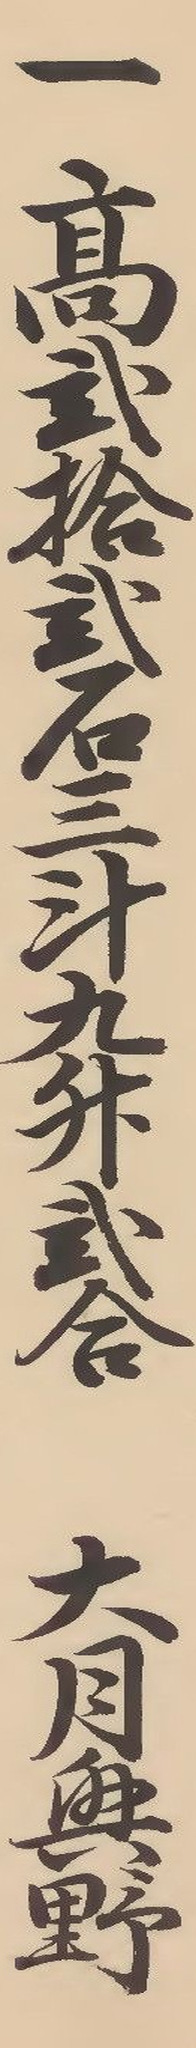一高弐拾弐石三斗九升弐合大月興野
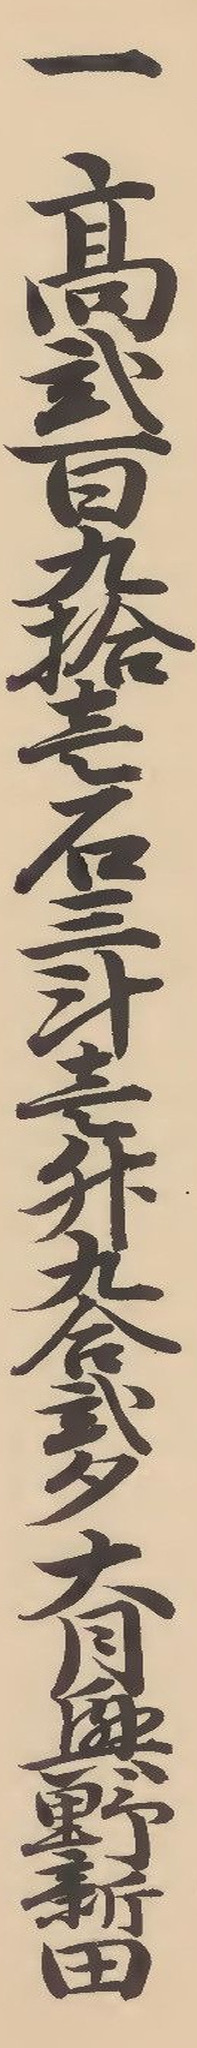一高弐百九拾壱石三斗壱升九合弐勺大月興野新田
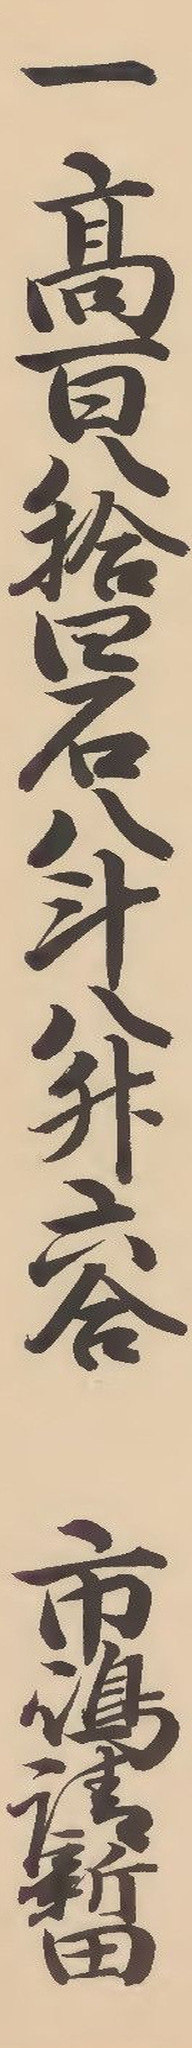一高百八拾四石八斗八升六合市島請新田

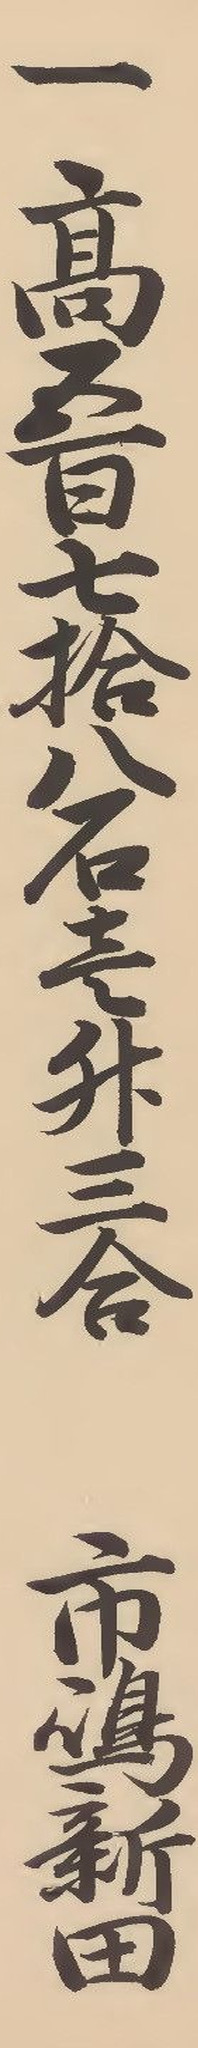一高五百七拾八石壱升三合市島新田
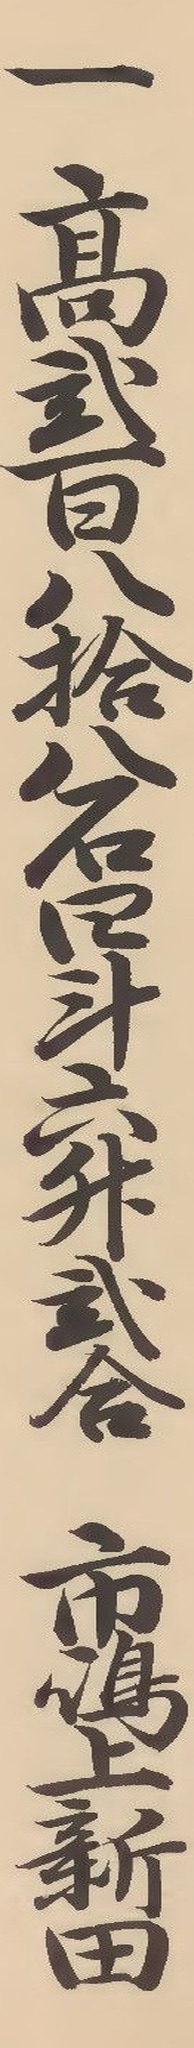一高弐百八拾八石四斗六升弐合市島上新田
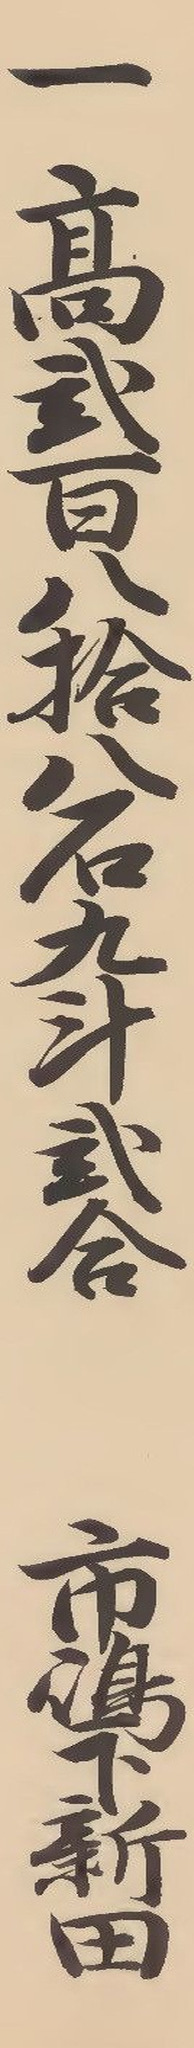一高弐百八拾八石九斗弐合市島下新田
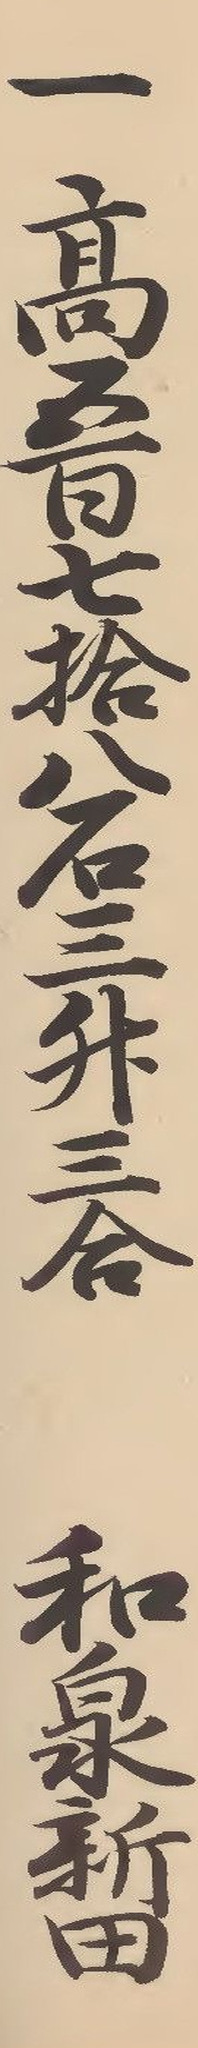一高五百七拾八石三升三合和泉新田
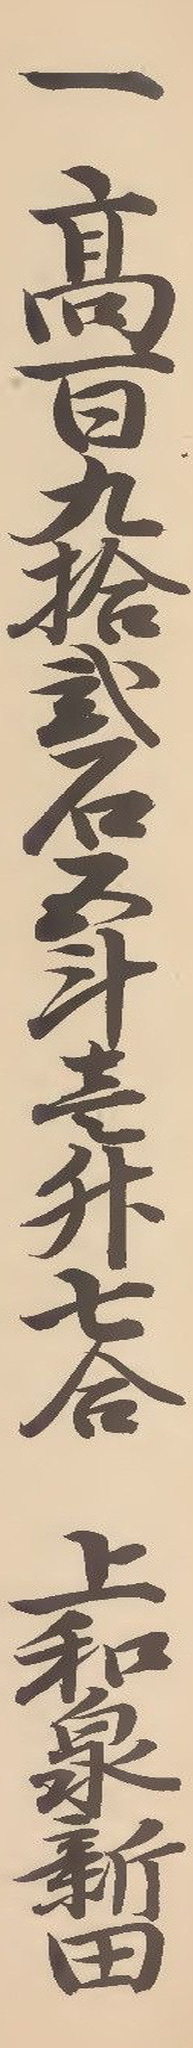一高百九拾弐石五斗壱升七合上和泉新田
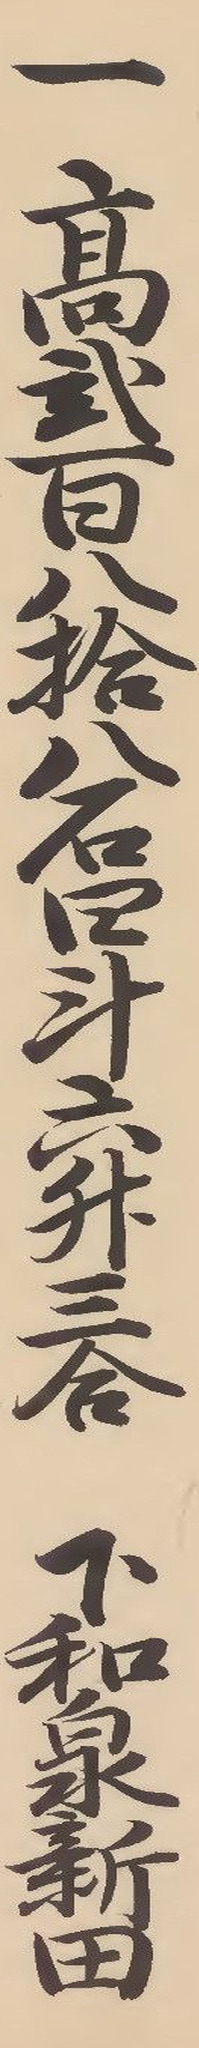一高弐百八拾八石四斗六升三合下和泉新田
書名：越後国郷帳　下
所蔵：国立公文書館 National Archives of Japan
